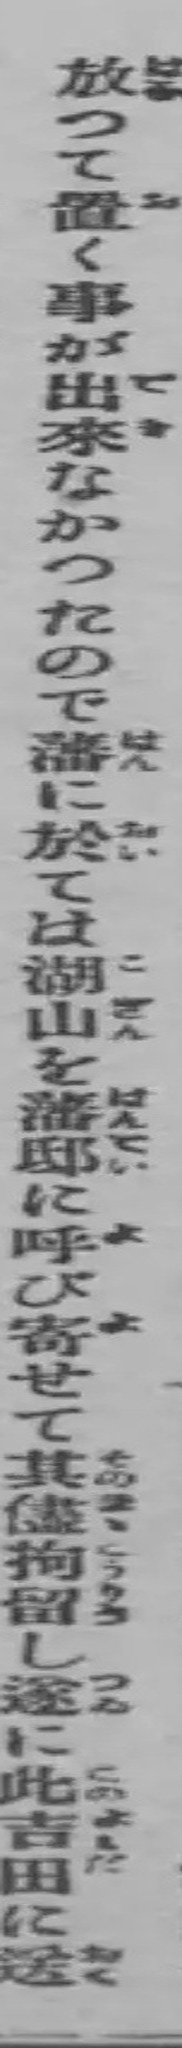放つて置く事が出来なかつたので藩に於ては湖山を藩邸に呼び寄せて其侭拘留し遂に此吉田に送
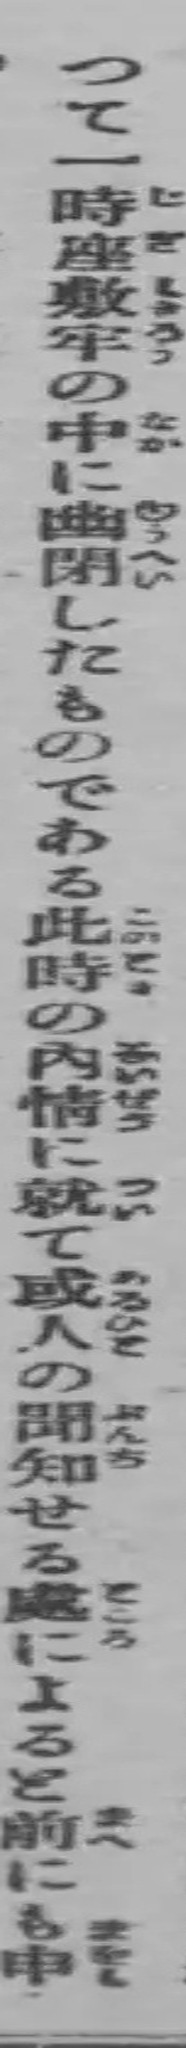つて一時座敷牢の中に幽閉したものである此時の内情に就て或人の聞知せる処によると前にも申
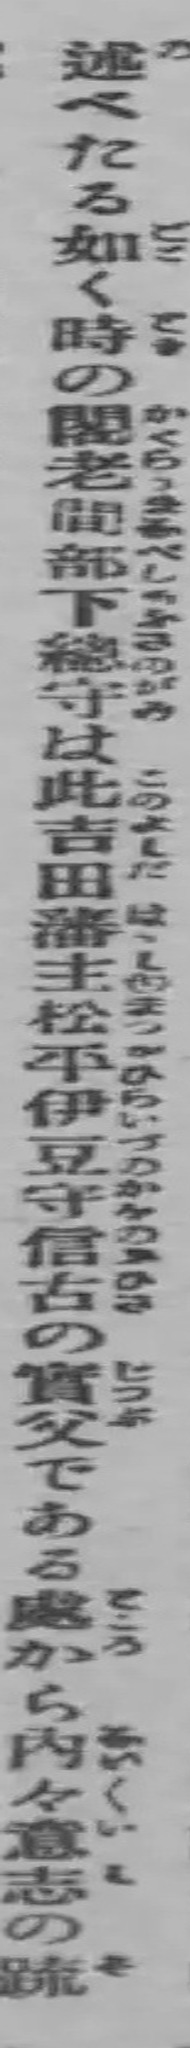述べたる如く時の閣老間部下総守は此吉田藩主松平伊豆守信古の実父である処から内々意志の疎
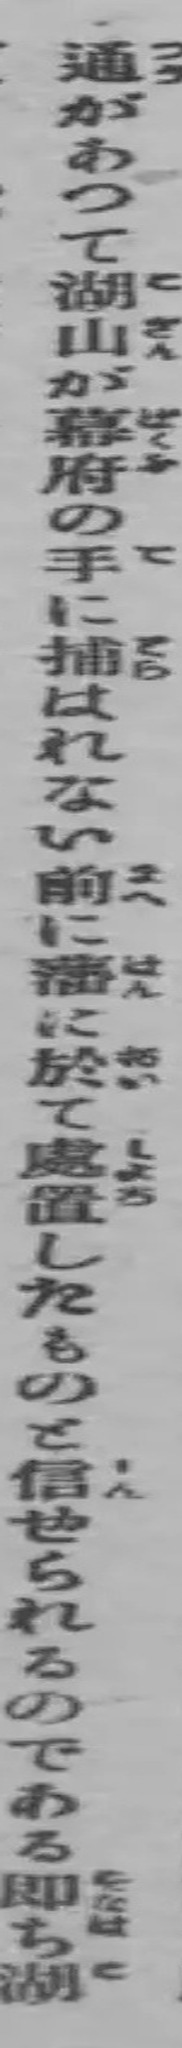通があつて湖山が幕府の手に捕はれない前に藩に於て処置したものと信ぜられるのである即ち湖
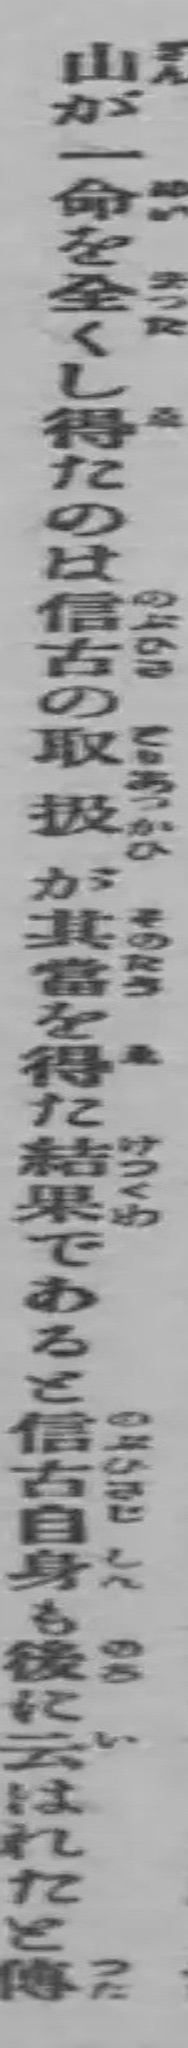山が一命を全くし得たのは信古の取扱が其当を得た結果であると信古自身も後に云はれたと伝
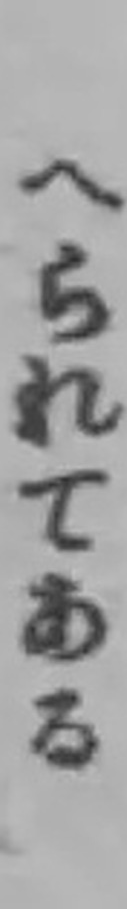へられてある

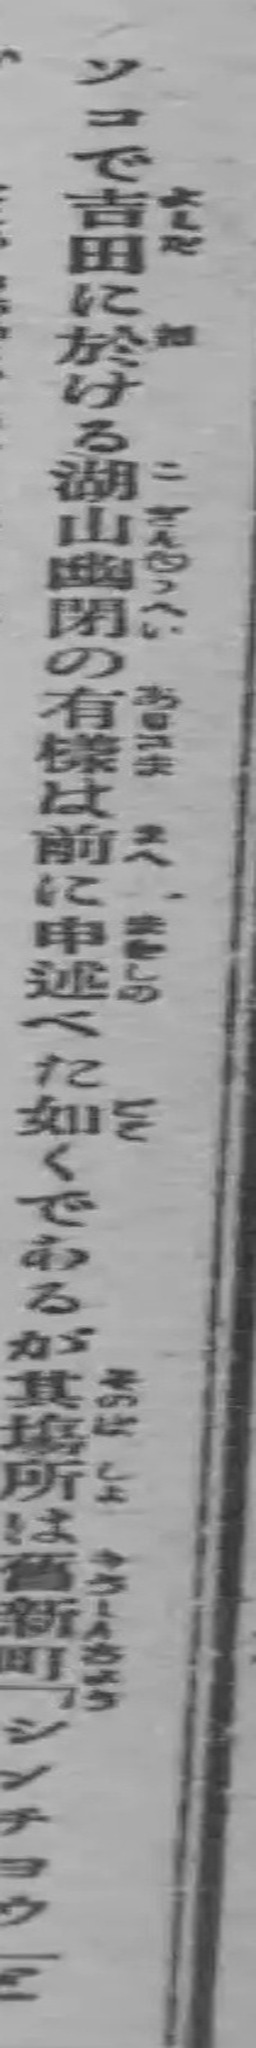ソコで吉田に於ける湖山幽閉の有様は前に申述べた如くであるが其場所は旧新町「シンチヨウ」と
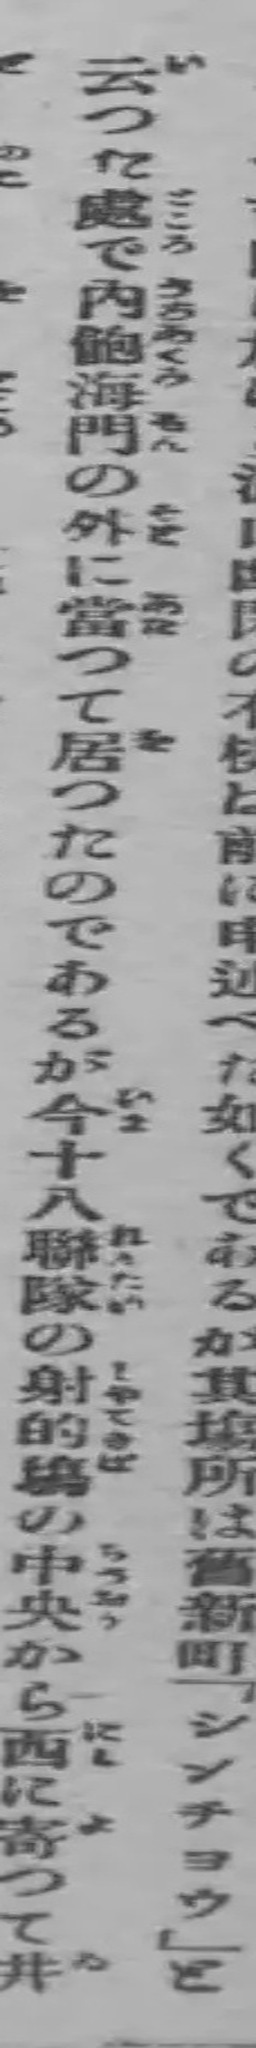云つた処で内飽海門の外に当つて居つたのであるが今十八連隊の射的場の中央から西に寄つて井
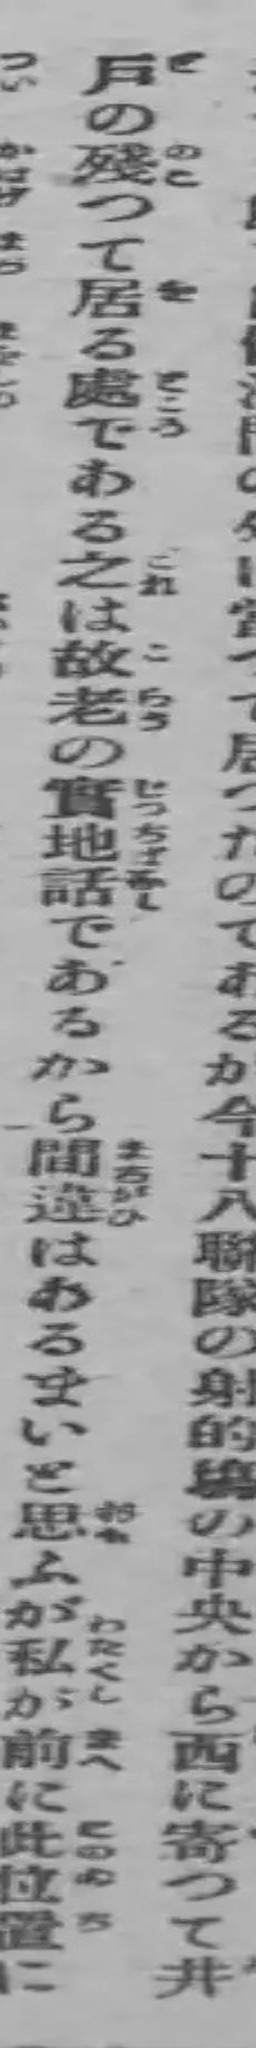戸の残つて居る処である之は故老の実地話であるから間違はあるまいと思ふが私が前に此位置に
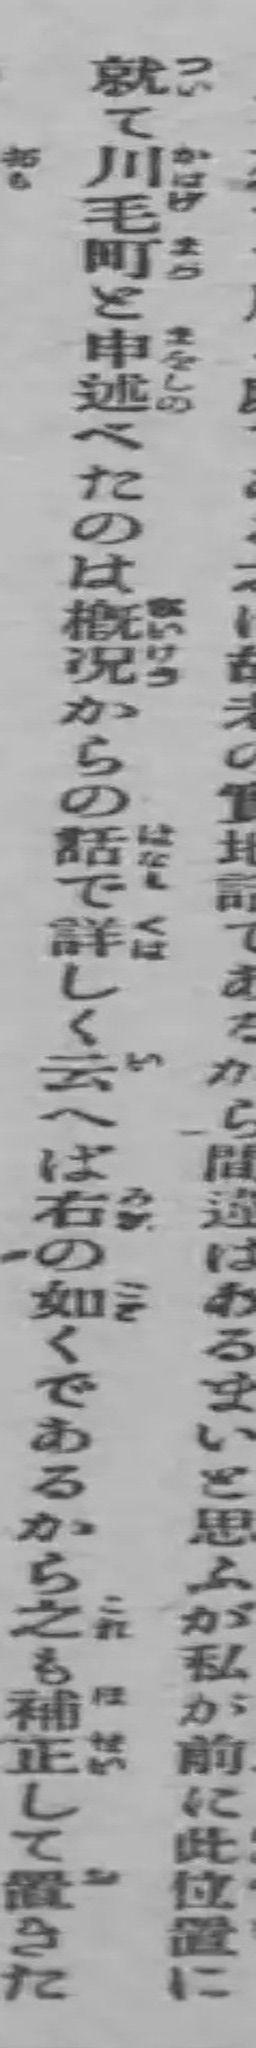就て川毛町と申述べたのは概況からの話で詳しく云へば右の如くであるから之も補正して置きた
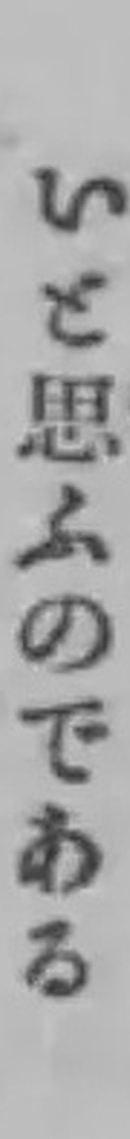いと思ふのである
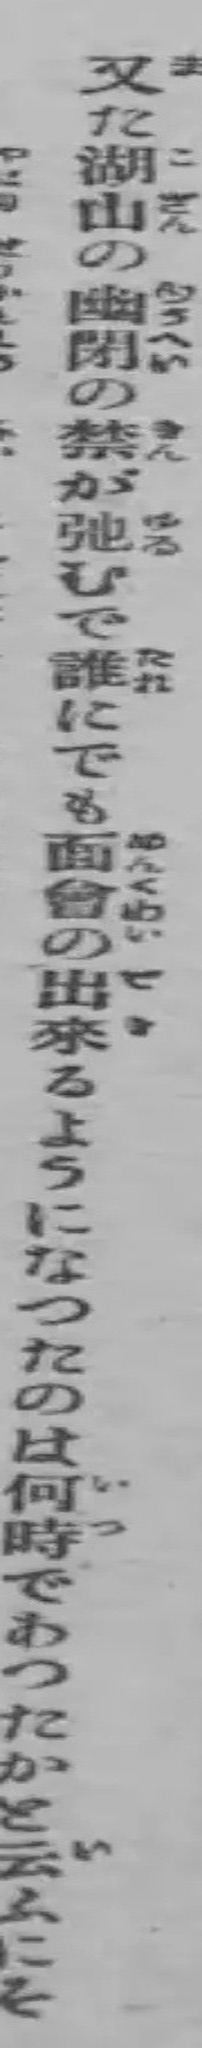又た湖山の幽閉の禁が弛むで誰にでも面会の出来るようになつたのは何時であつたかと云ふにそ
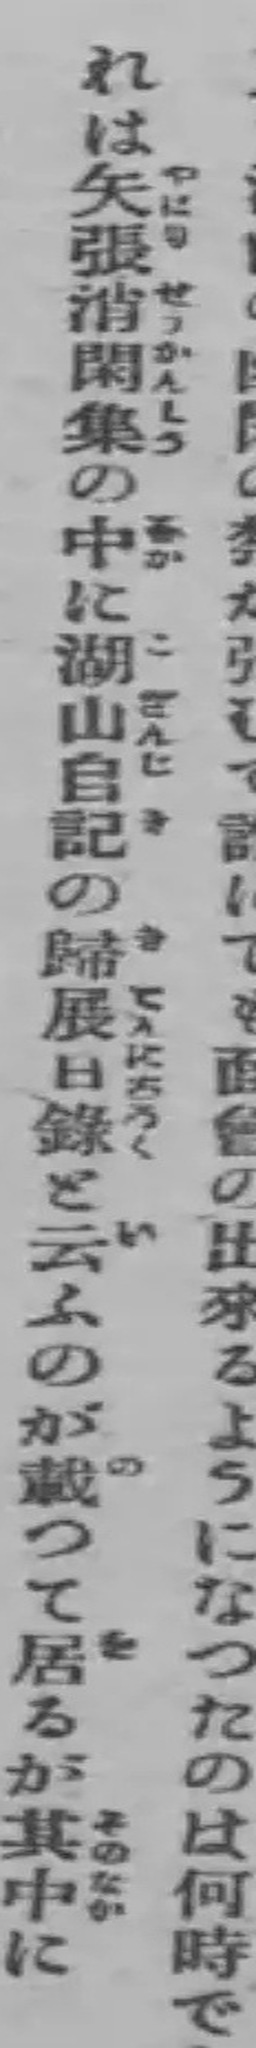れは矢張消閑集の中に湖山自記の帰展日録と云ふのが載つて居るが其中に
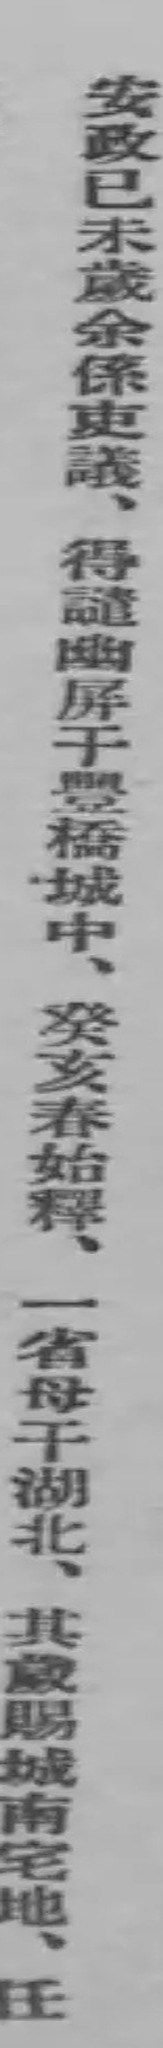安政巳未歳余係吏議、得譴幽屏干豊橋城中、癸亥春始釈、一省母干湖北、其歳賜城南宅地、任
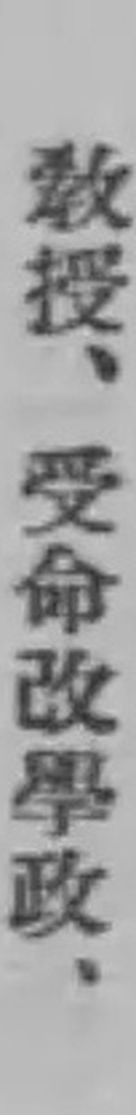教授、受命改学政、
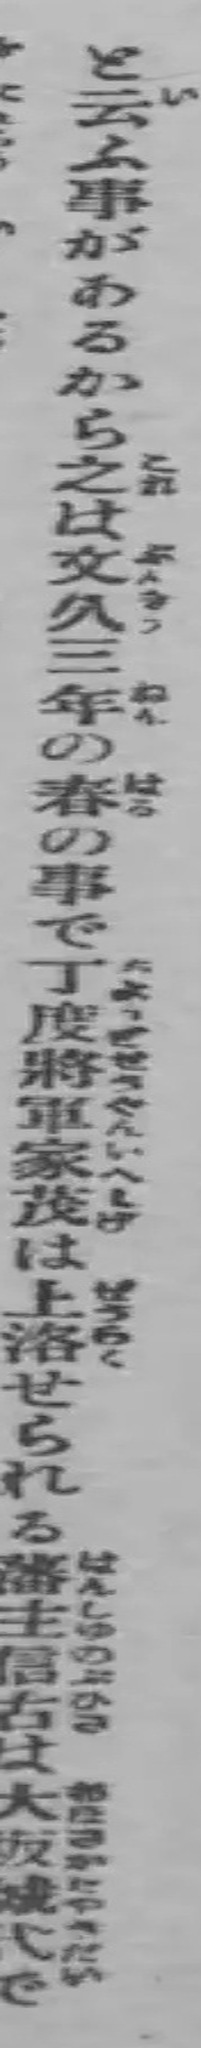と云ふ事があるから之は文久三年の春の事で丁度将軍家茂は上洛せられる藩主信古は大坂城代で
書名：豊橋市史談
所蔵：国立国会図書館 National Diet Library, JAPAN
